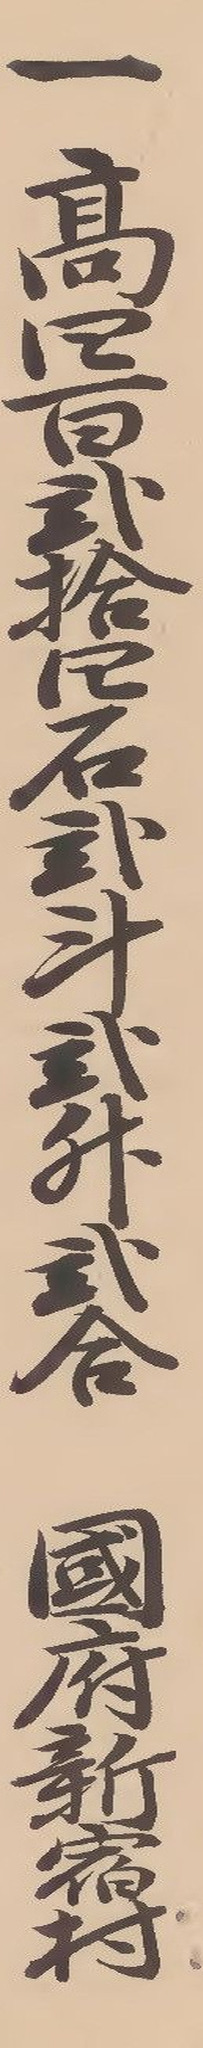一高四百弐拾四石弐斗弐升弐合国府新宿村
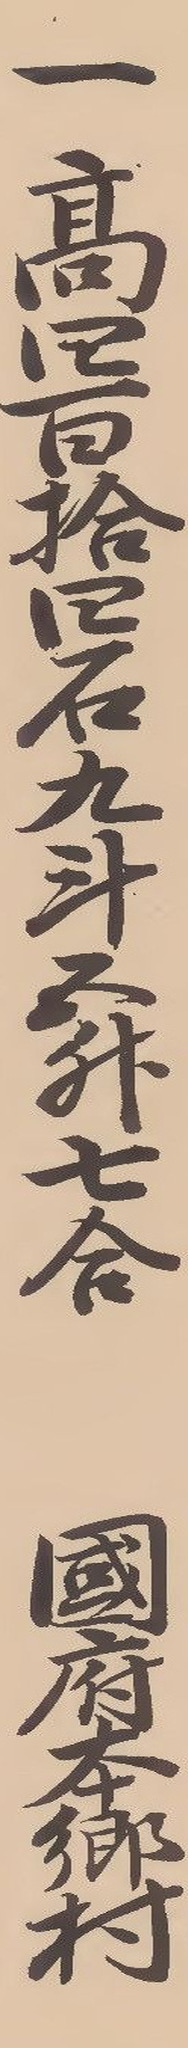一高四百拾四石九斗五升七合国府本郷村
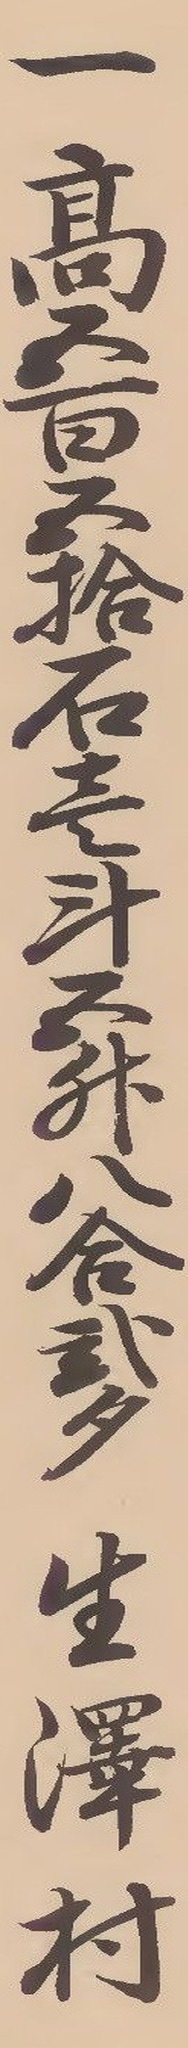一高五百五拾石壱斗五升八合弐勺生澤村

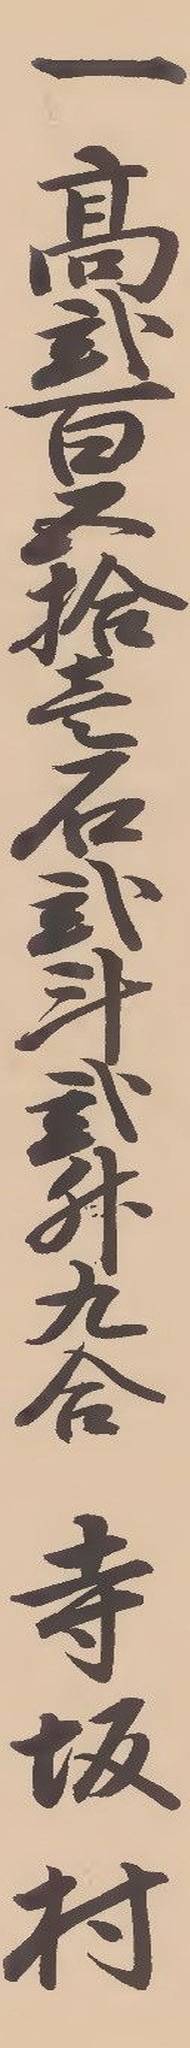一高弐百五拾壱石弐斗弐升九合寺坂村
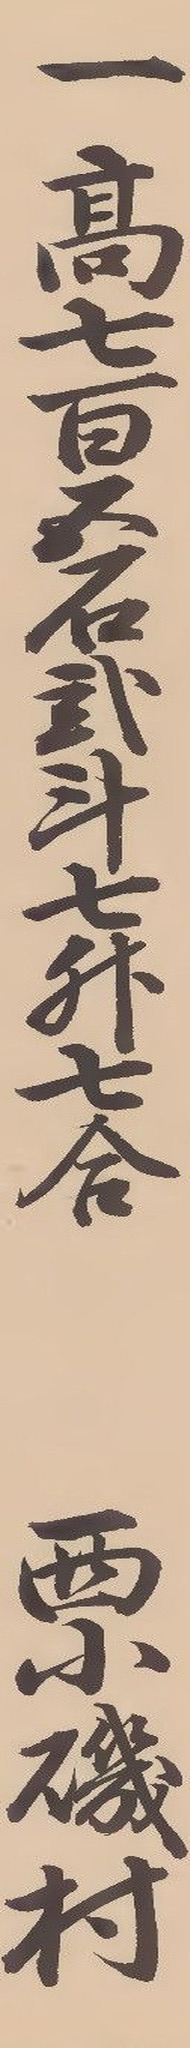一高七百五石弐斗七升七合西小磯村
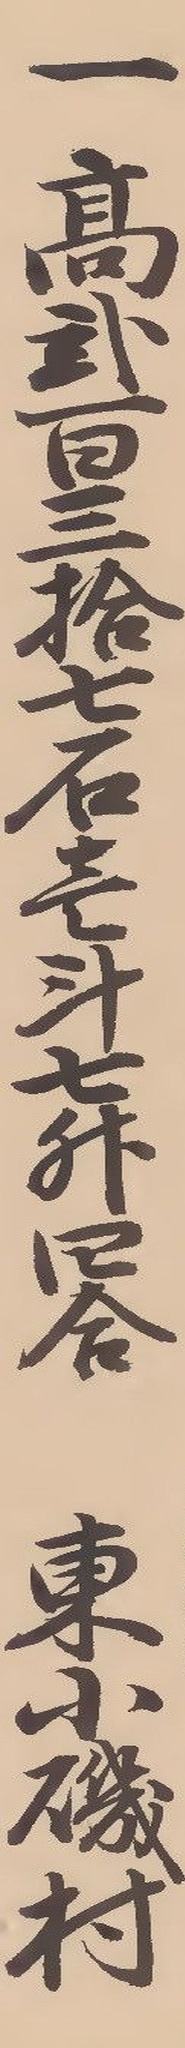一高弐百三拾七石壱斗七升四合東小磯村
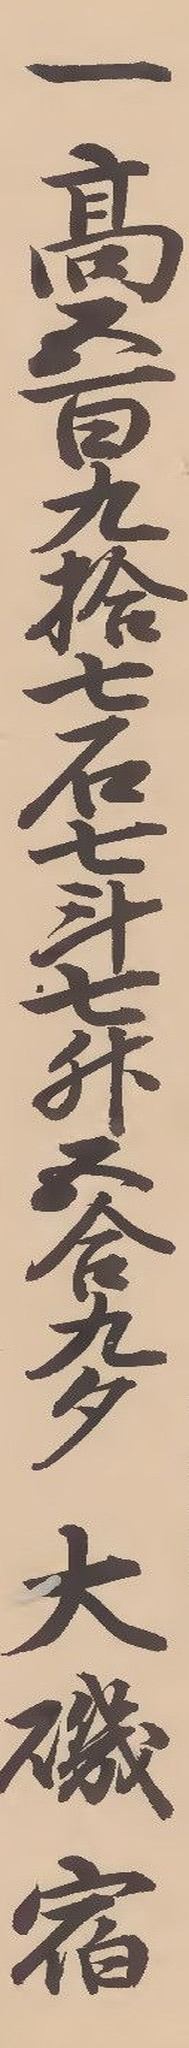一高五百九拾七石七斗七升五合九勺大磯宿
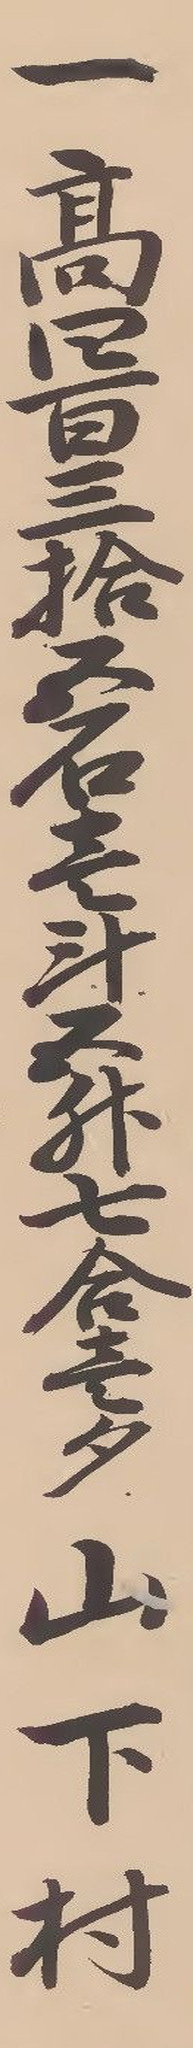一高四百三拾五石壱斗五升七合壱勺山下村
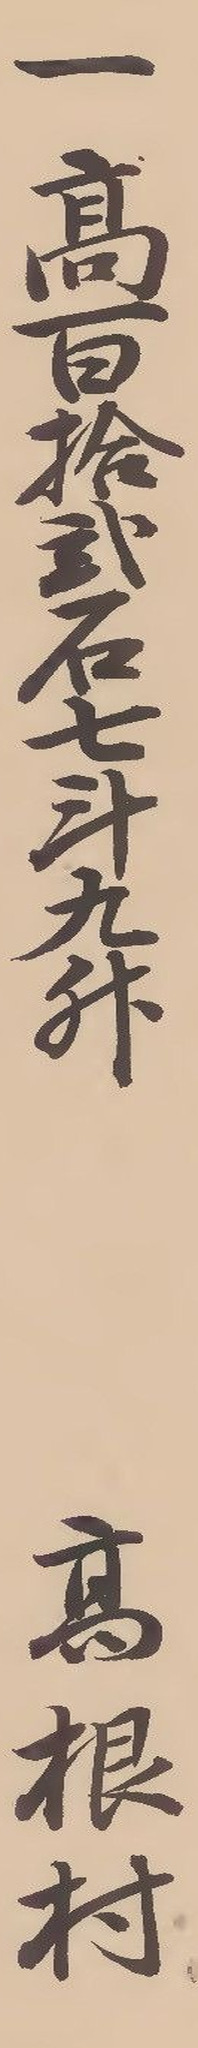一高百拾弐石七斗九升高根村
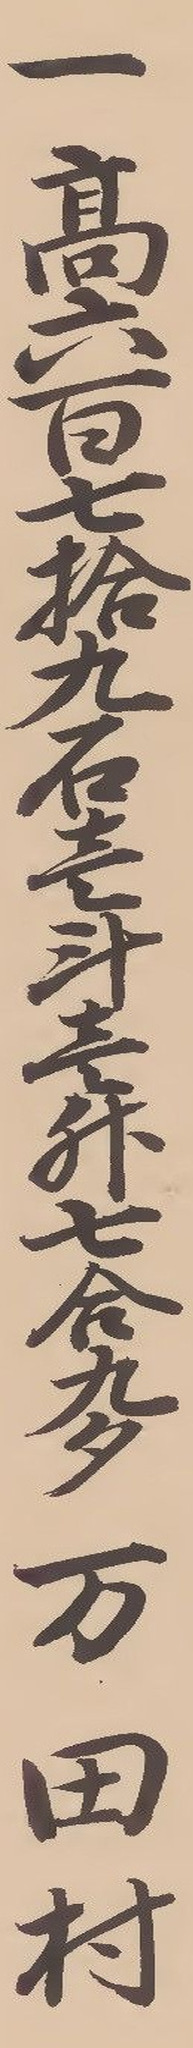一高六百七拾九石壱斗壱升七合九勺万田村
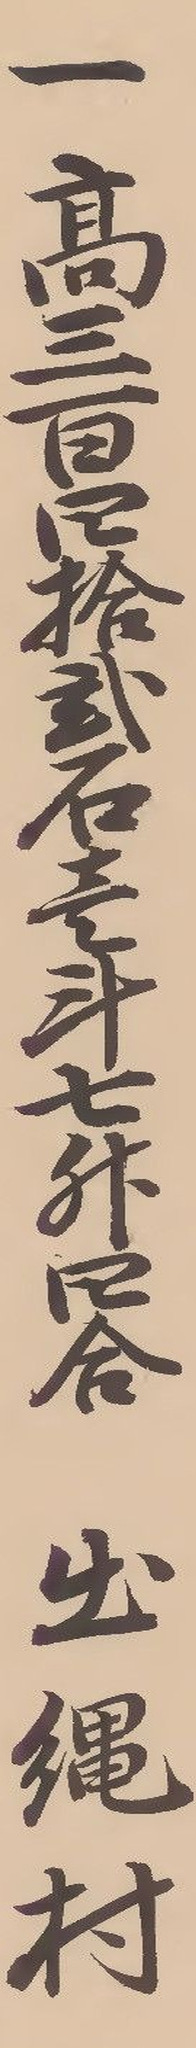一高三百四拾弐石壱斗七升四合出縄村

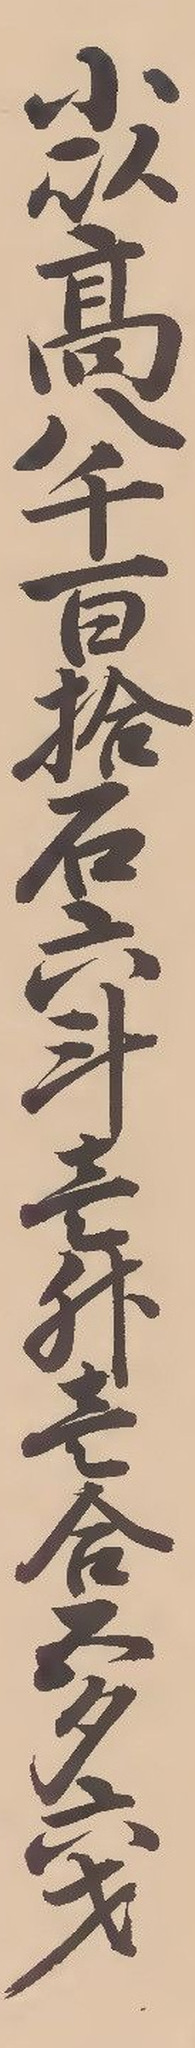小以高八千百拾石六斗壱升壱合五勺六才
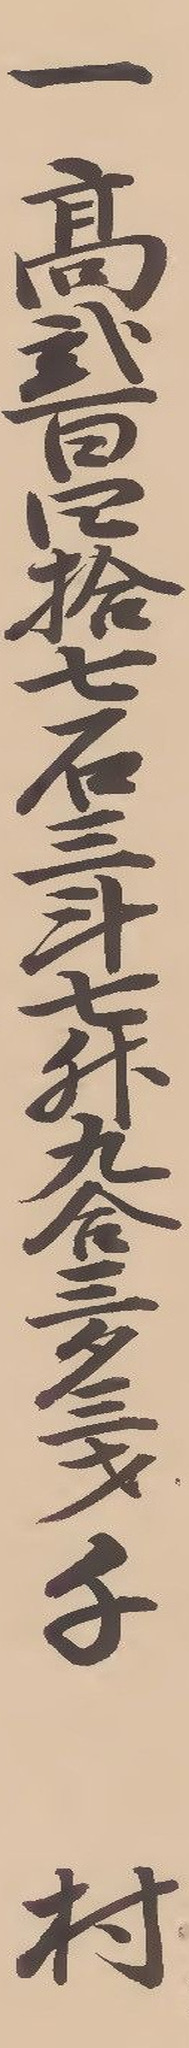一高弐百四拾七石三斗七升九合三勺三才千村
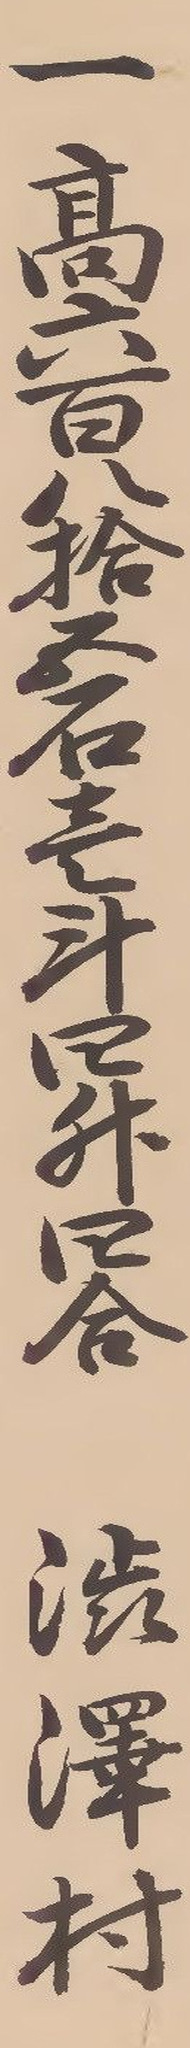一高六百八拾五石壱斗四升四合渋澤村
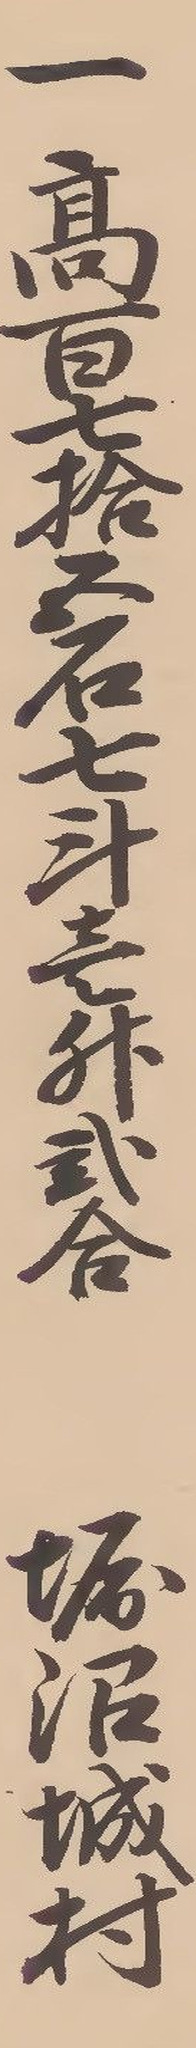一高百七拾五石七斗壱升弐合堀沼城村

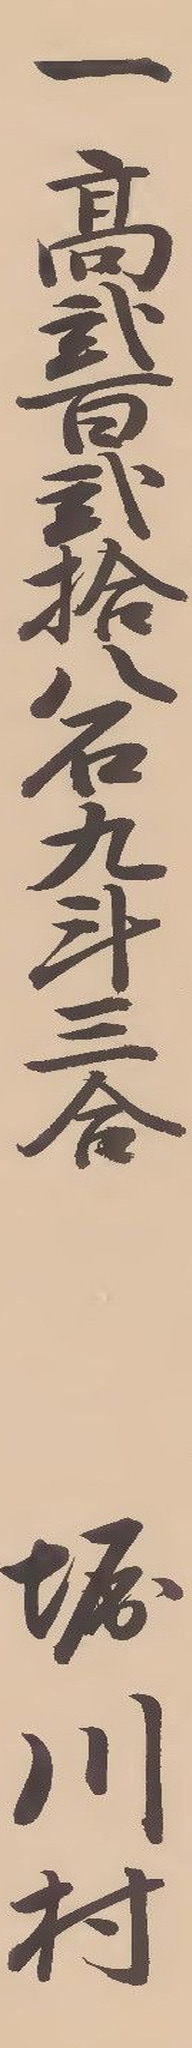一高弐百弐拾八石九斗三合堀川村
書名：相模国郷帳
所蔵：国立公文書館 National Archives of Japan
